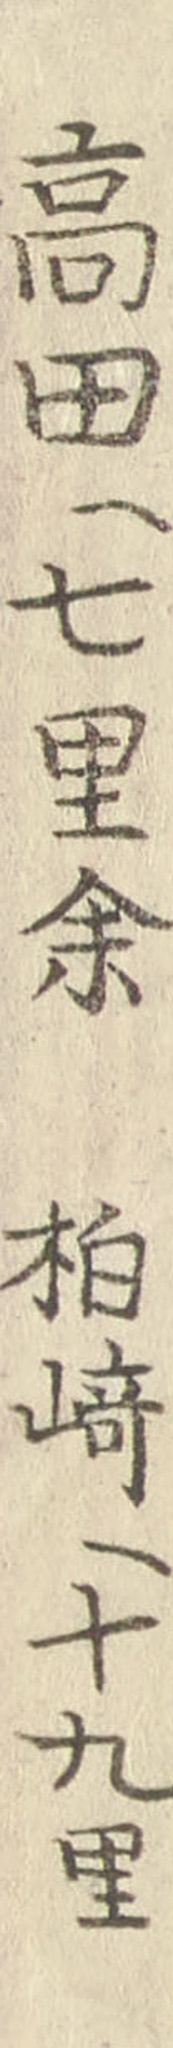高田ヘ七里余柏崎ヘ十九里
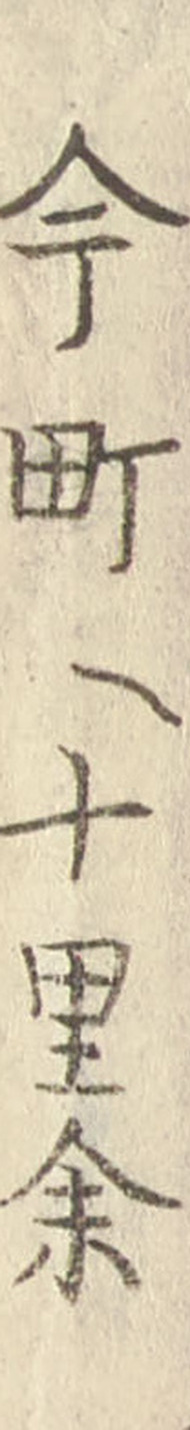今町ヘ十里余
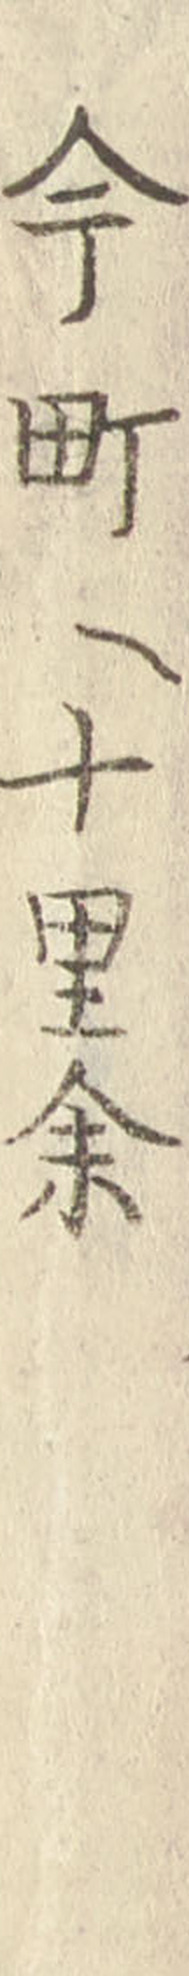今町ヘ十里余
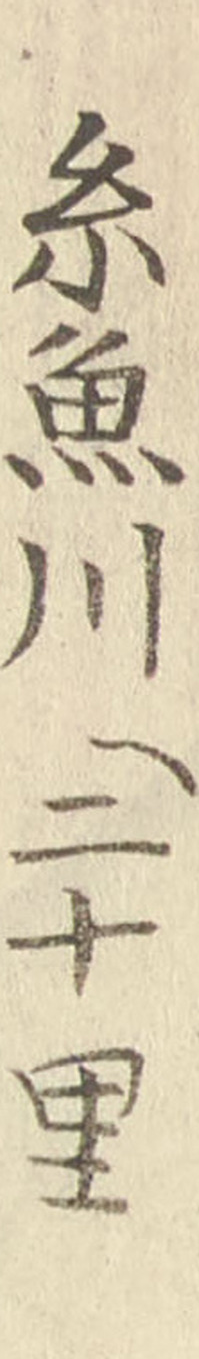糸魚川ヘ二十里
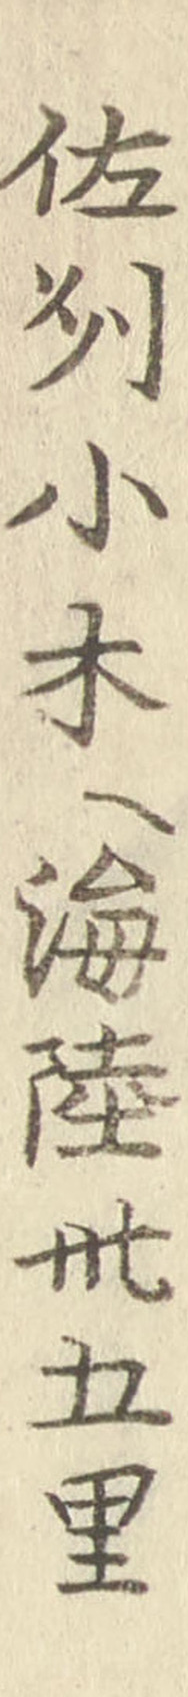佐州小木ヘ海陸丗五里
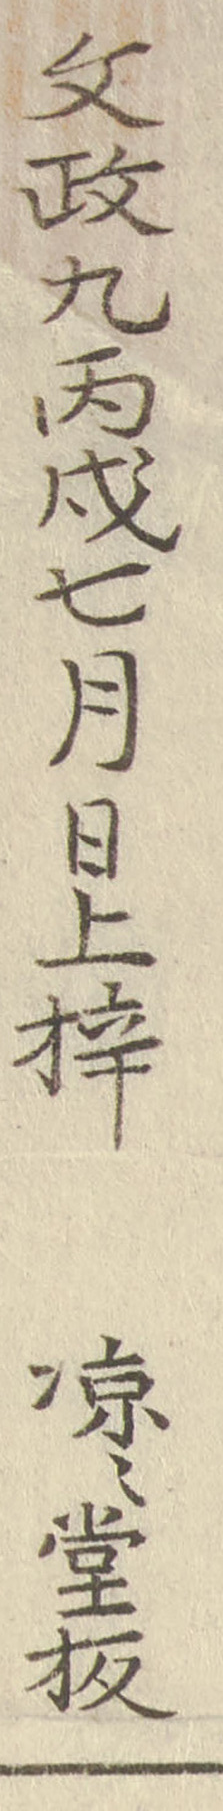文政九丙戌七月日上梓涼々堂板
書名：一本木温泉之記
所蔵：東京大学総合図書館 General Library in the University of Tokyo, JAPAN
